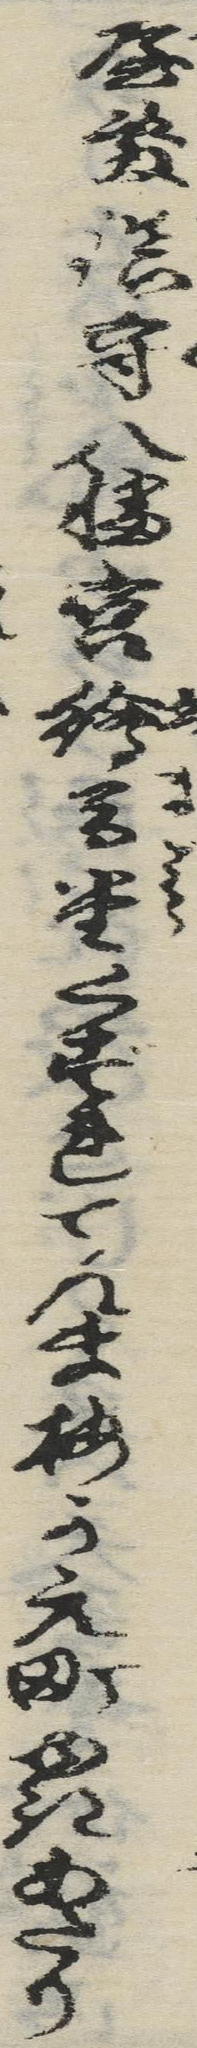屋敷鎮守八幡宮絵馬堂くずれてんま梅かえ町ゆきあたり
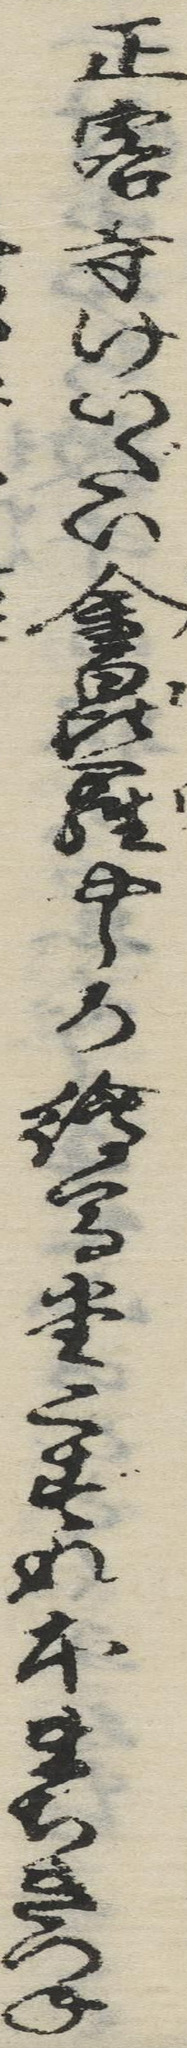正客寺けいだい金毘羅やしろ絵馬堂くずれ本まちきつね
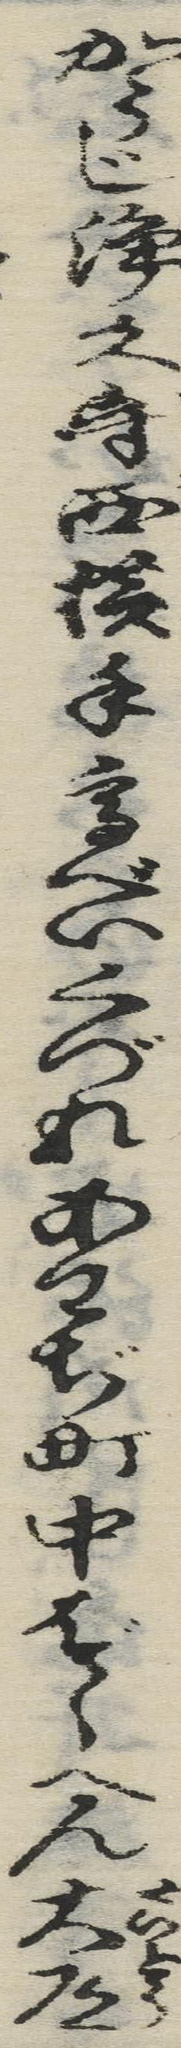かうじ浄久寺西横手高べいくづれあわじ町中ばしへん大道
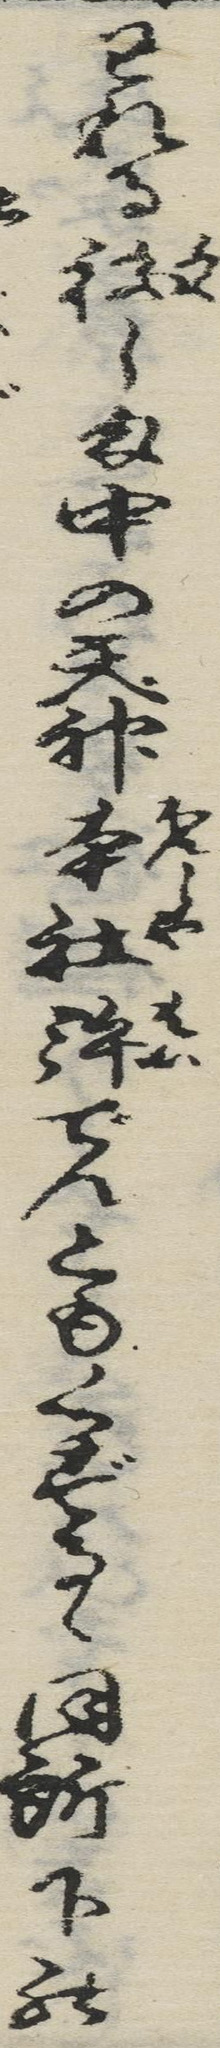われる福しま中の天神本社拝でんともくずるゝ同所下の
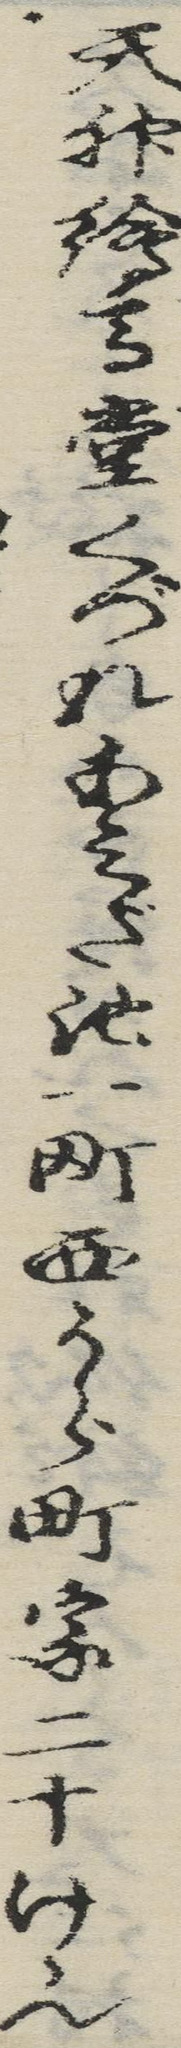天神絵馬堂くづれあみだ池一町西うら町家二十けん
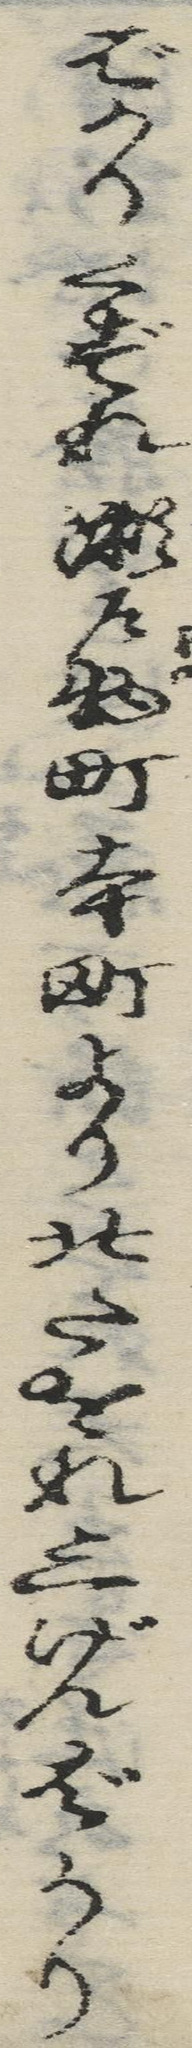ばかりくずれ瀬戸物町本町より北たをれ三げんばかり
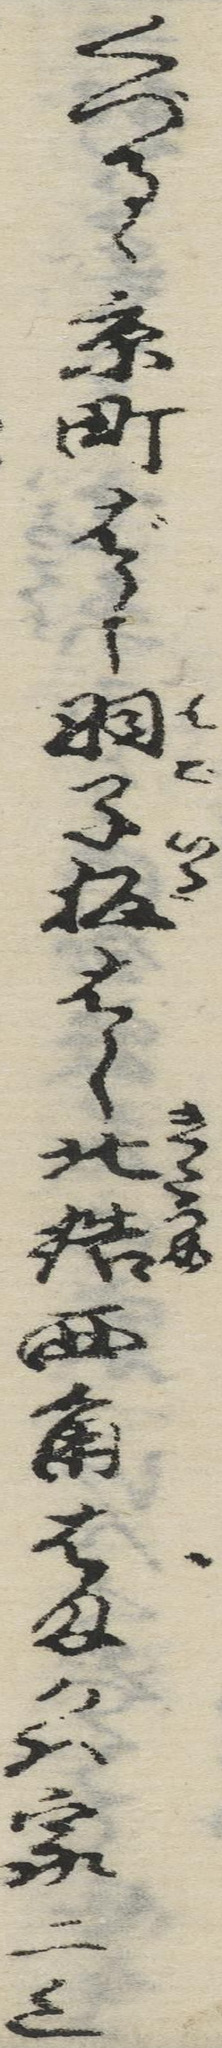くづるゝ京町ばし羽子板はし北詰西角はまかは家二三
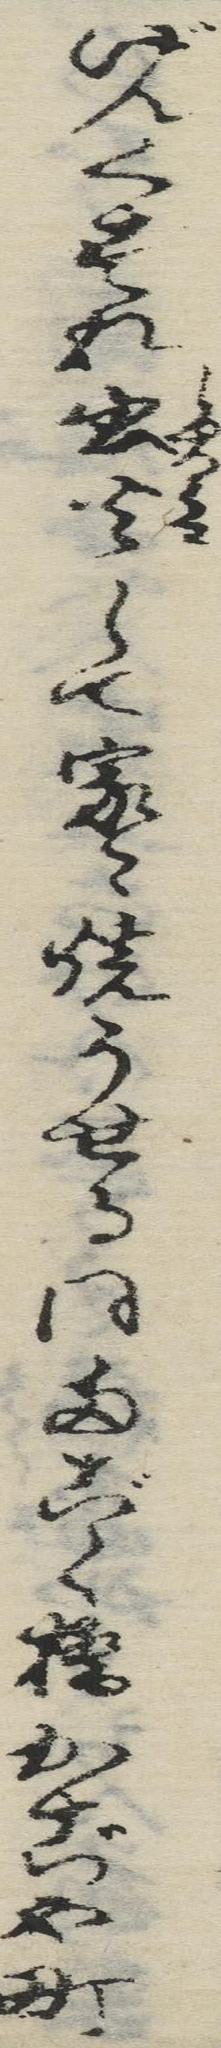げんくすれ出火して家々焼けうせる同両ごく橋かごや町
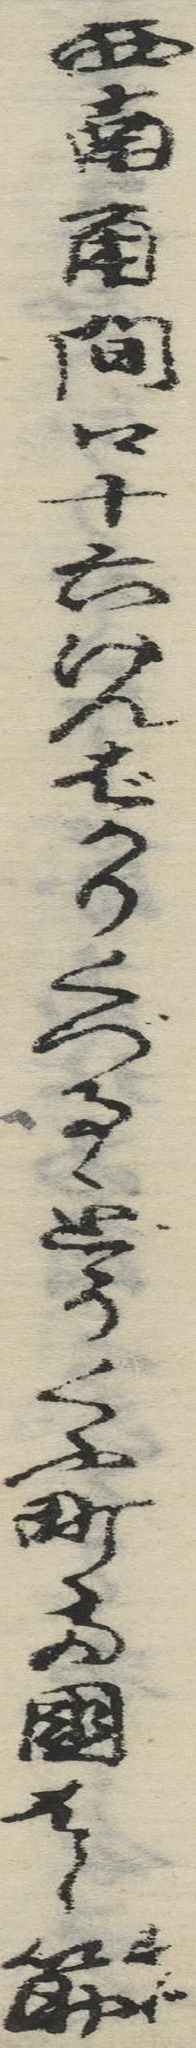西南角間口十六けんはかりくづるゝどうくに町両国はし筋
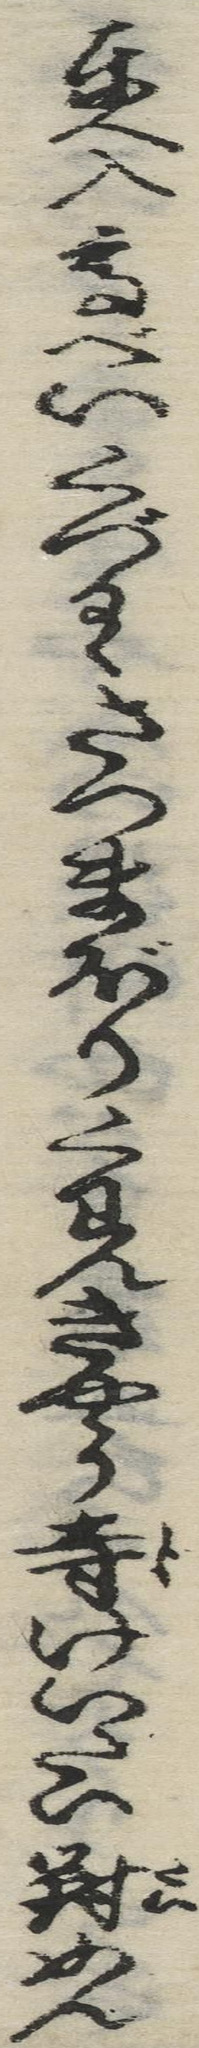東へ入高べいくづるゝさつまぼりくわんきゆう寺けいたい対めん

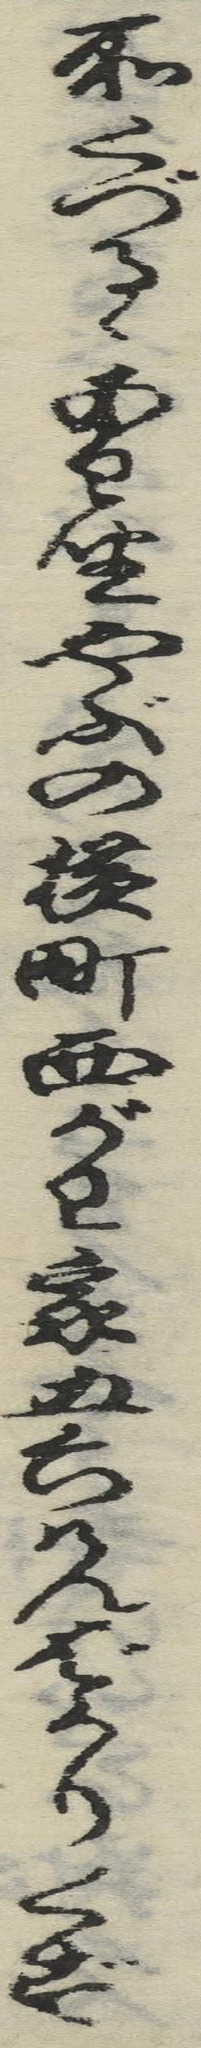所くづるゝあわ座やぶの横町西がわ家五六けんばかりくず
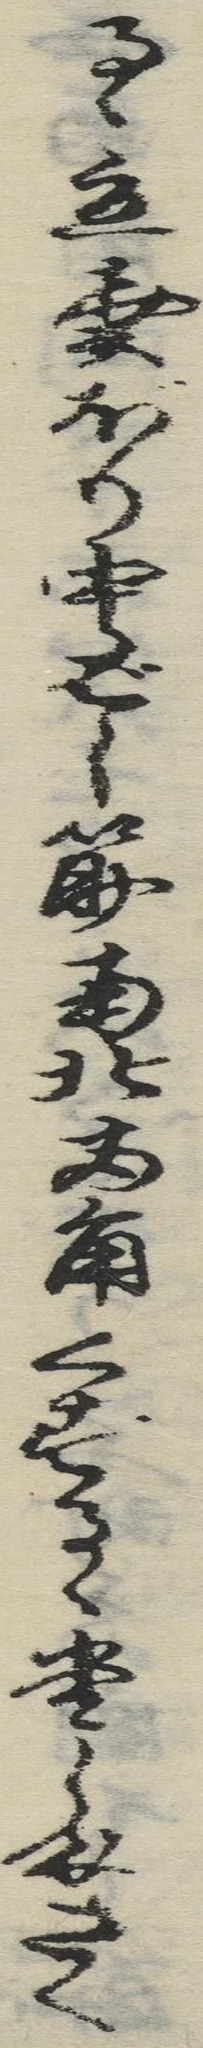るゝ魚売ぼり中ばし筋南北両角くずるゝ堂しまさく
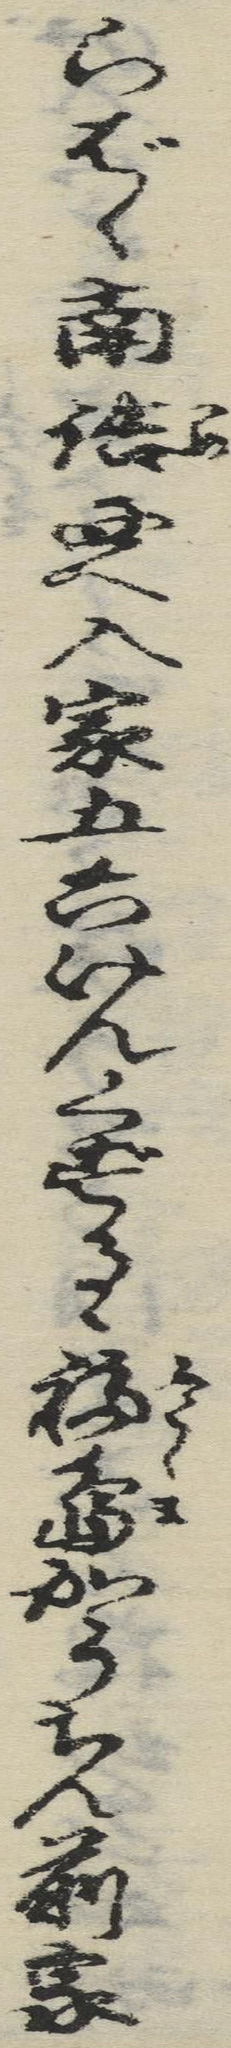らばし南詰西へ入家五六けんくずるゝ福島かうちん前家
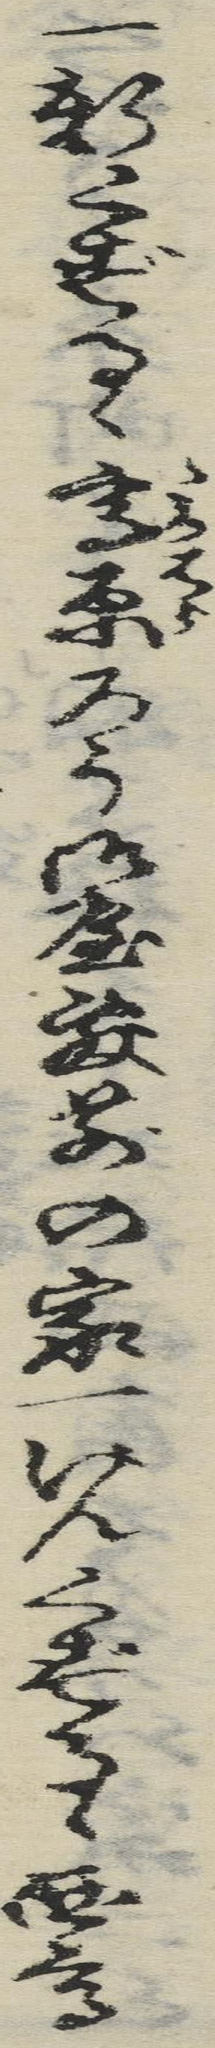一軒くずるゝ高原ろう御屋敷前の家一けんくずるゝ西高
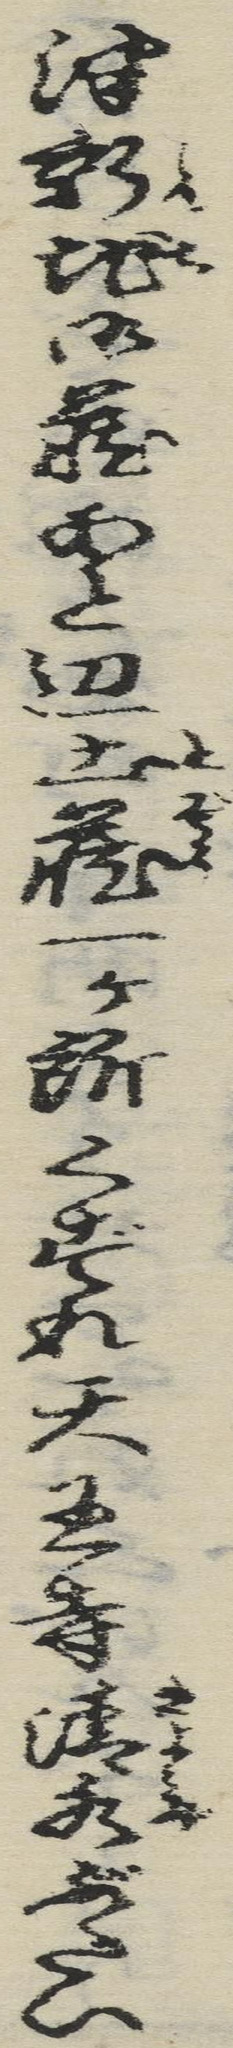津新地御蔵あと辺土蔵一ヶ所くずれ天王寺清水ぶたい
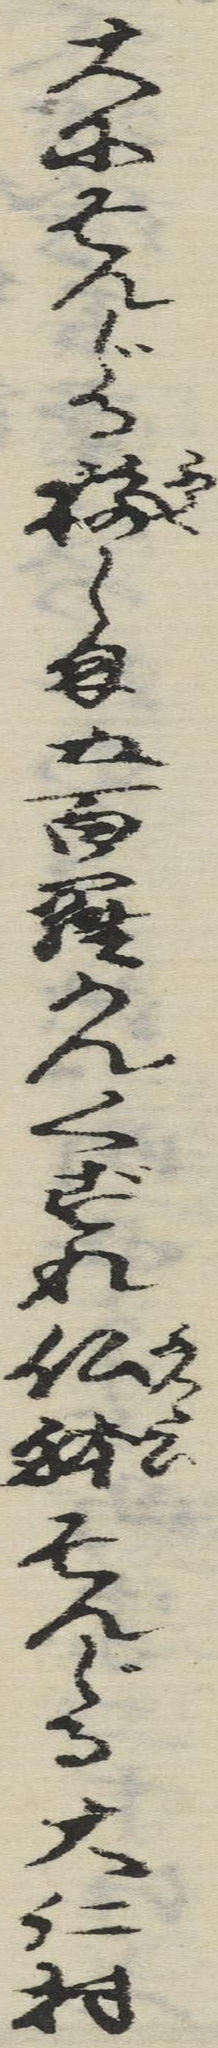大にそんじる福しま五百羅かんくずれ仏體そんじる大仁村
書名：諸国海辺地震津波書
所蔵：東京大学地震研究所図書室 Earthquake Research Institute Library, The University of Tokyo, JAPAN
